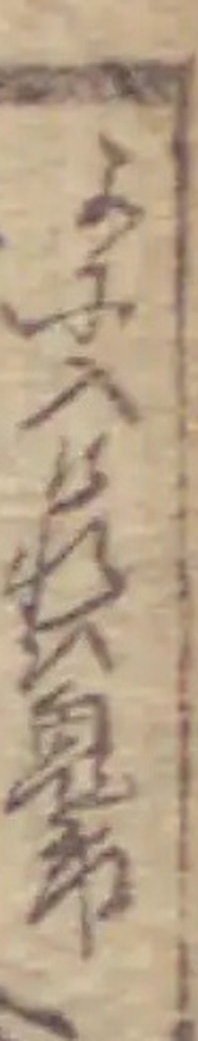よに入けれは鬼市
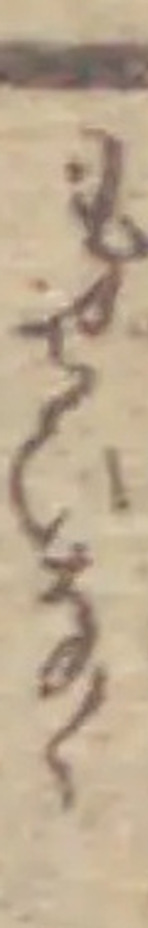もせひなく
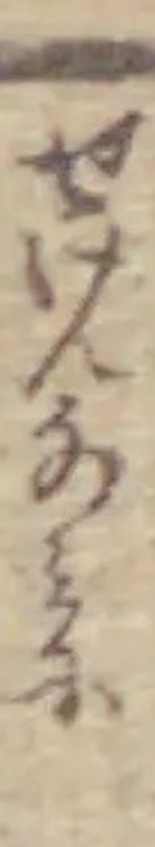せけんなみに
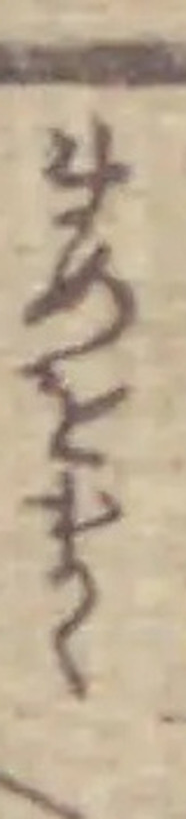まめをまく
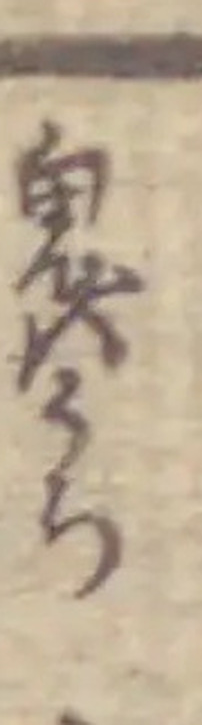鬼はうち
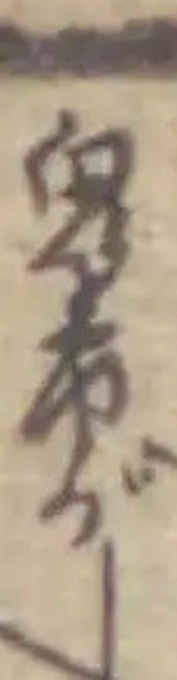鬼市が
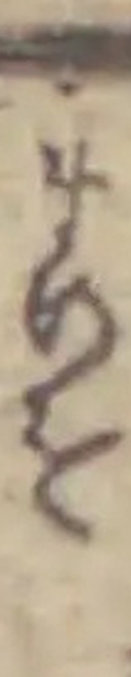まめを
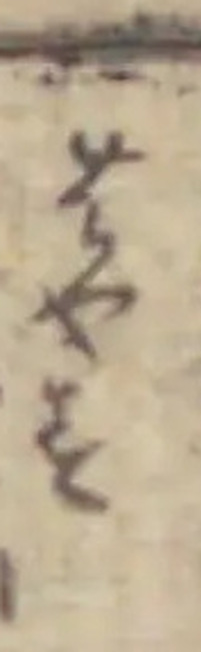はやす
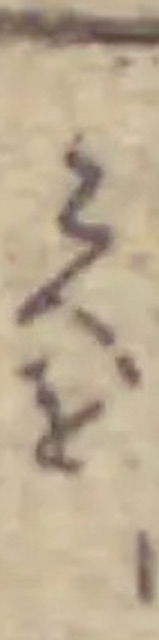こへを
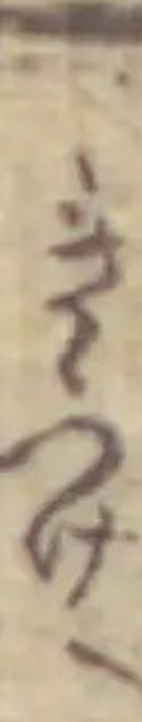きゝつけ
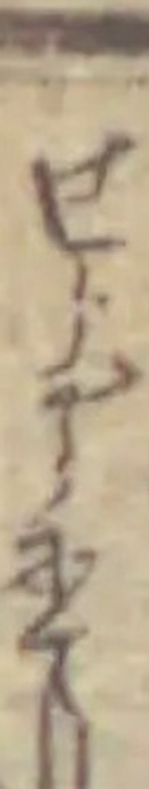せじやうにて
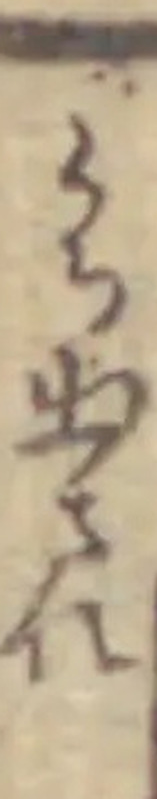うち出され
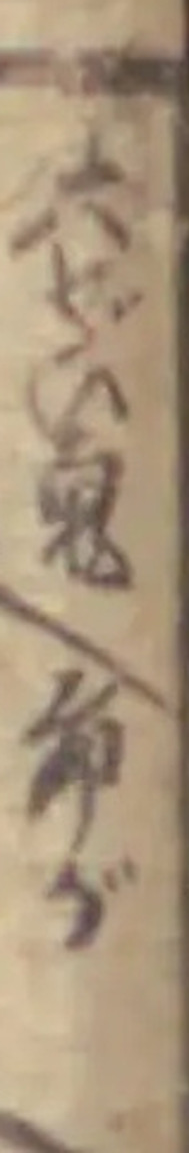大ぜい鬼市が
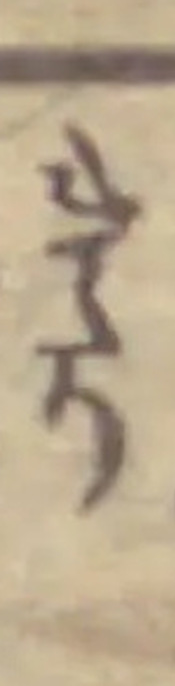きたり
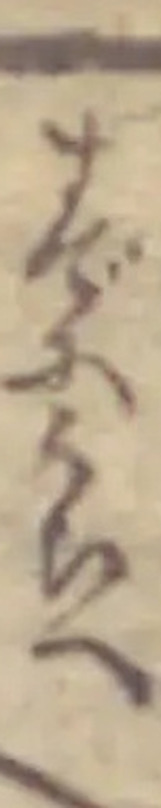すでにうちへ
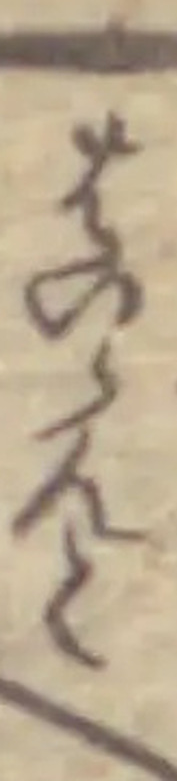はいらんと
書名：鬼子宝 3巻
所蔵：国立国会図書館 National Diet Library, JAPAN
